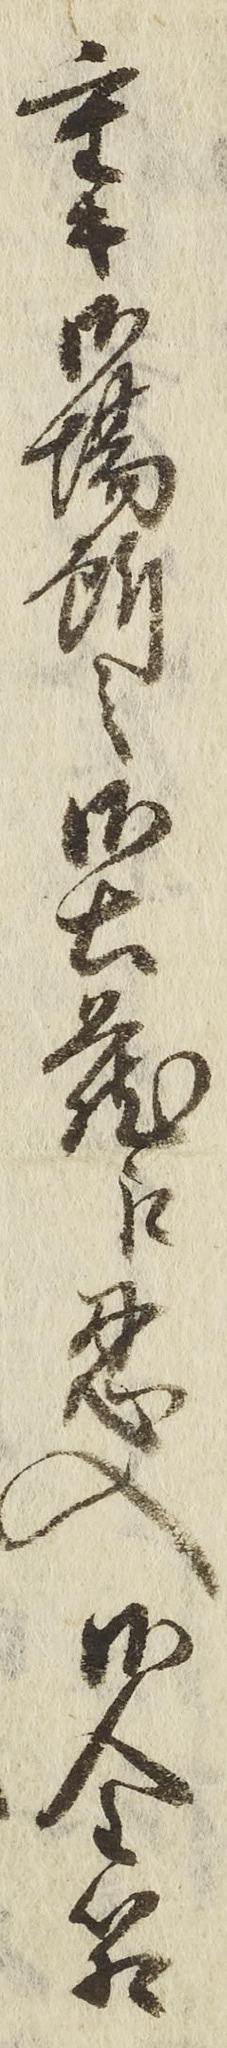重キ御場所之御土蔵江忍入御金箱
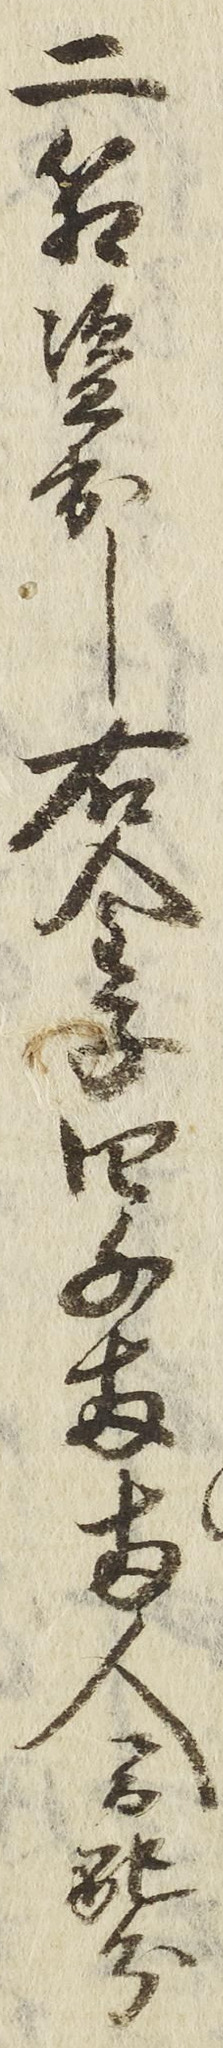二箱盗出し右金子四千両両人二而配分
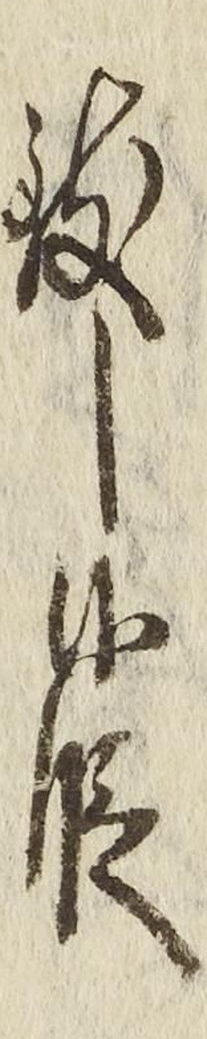致し候段
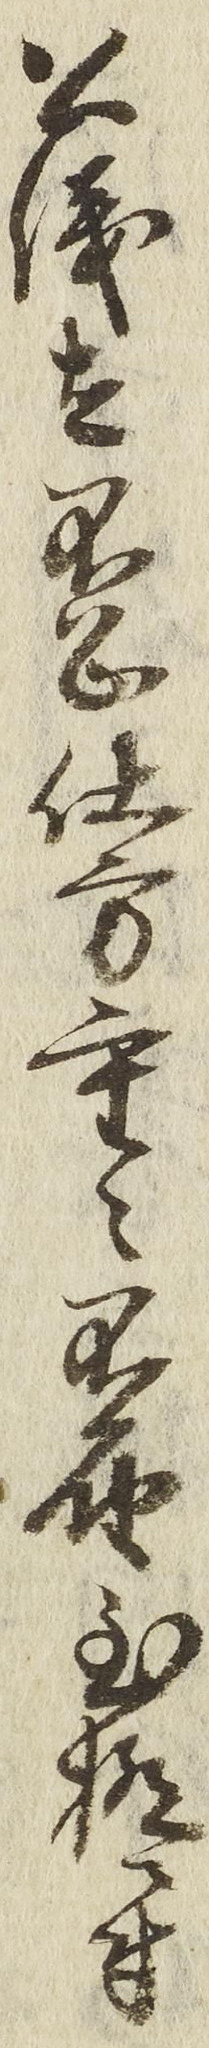公儀を不恐仕方重々不届至極二付
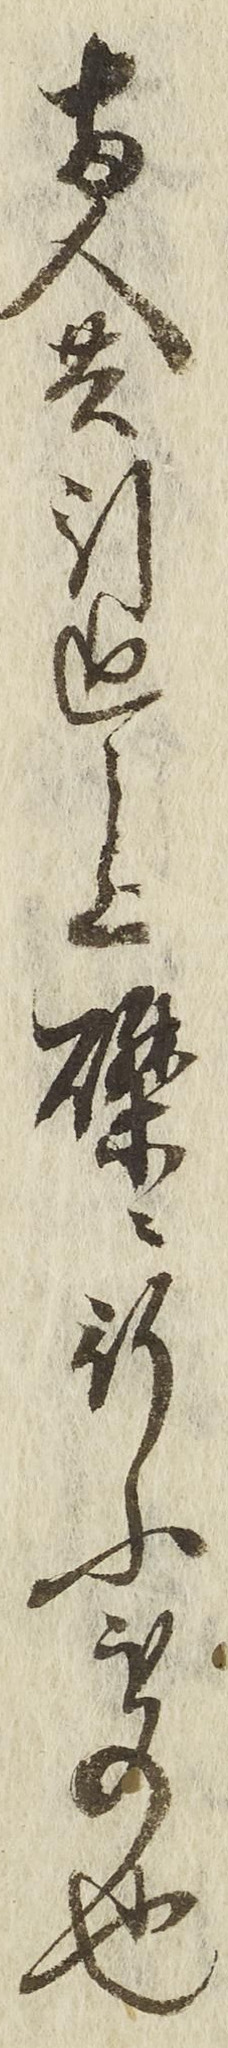両人共引廻之上磔に行ふもの也
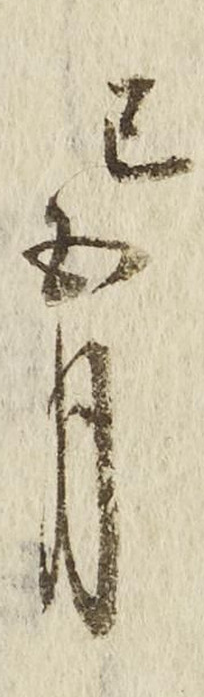巳五月

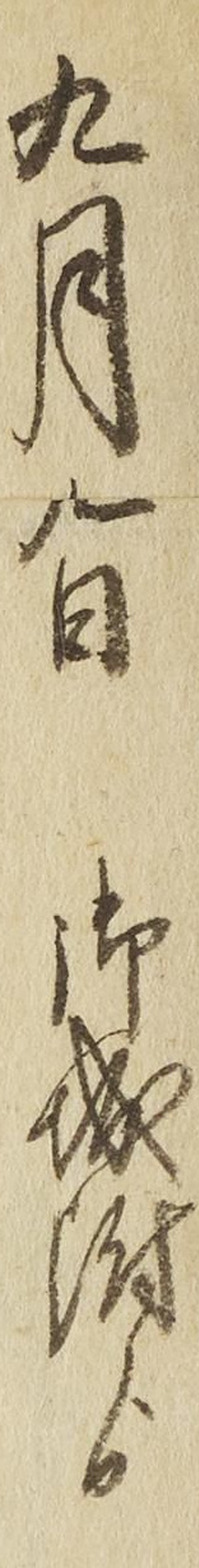九月八日御城附ゟ
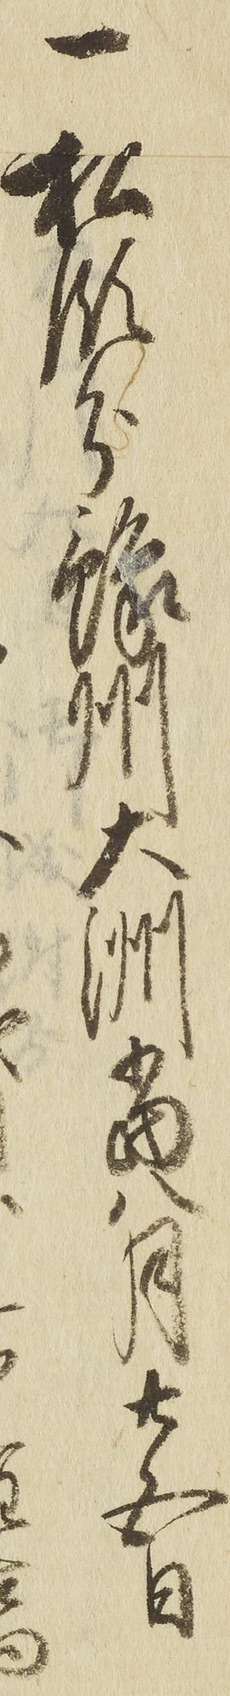一私領分予州大洲当八月廿五日
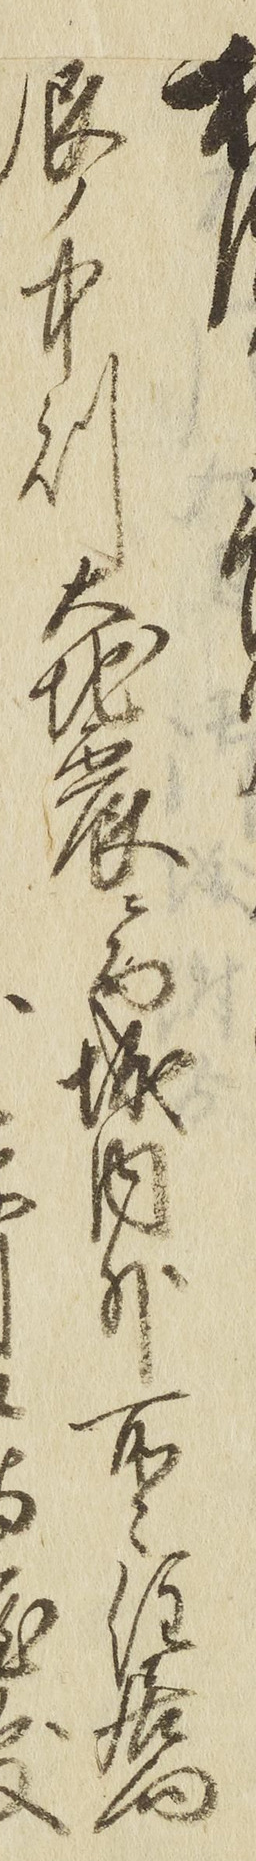辰ノ中刻大地震二而城内外所々住居向
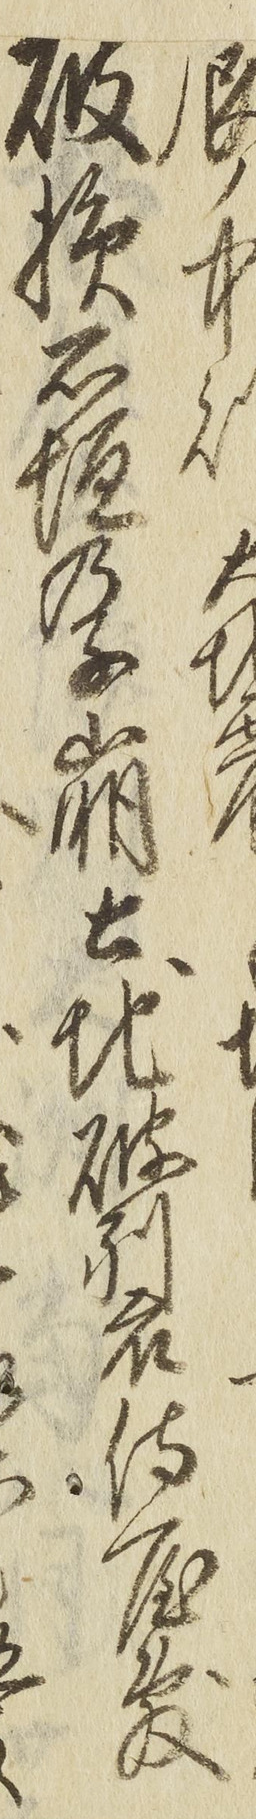破損石垣孕崩土地破裂侍屋敷
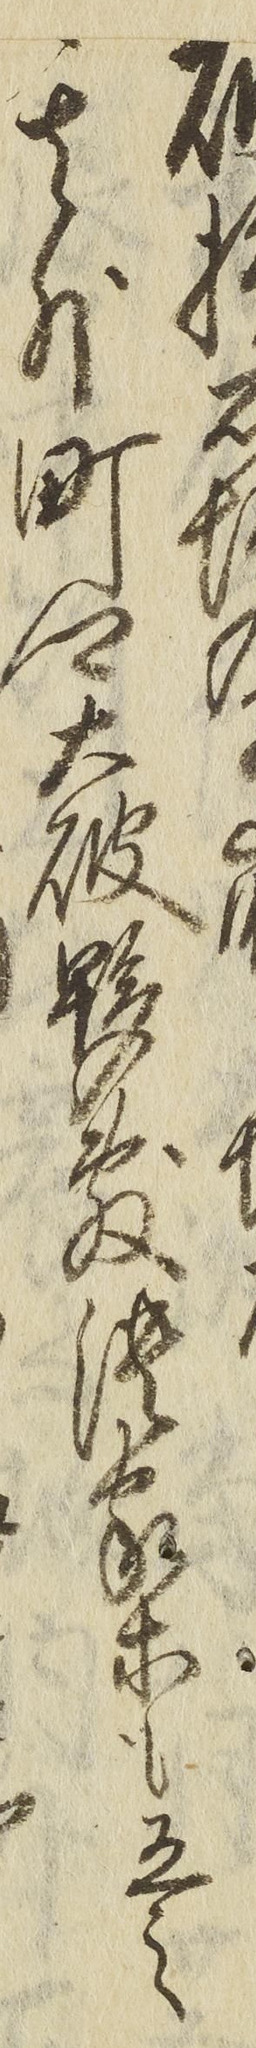其外町郷大破夥敷潰家等も有之
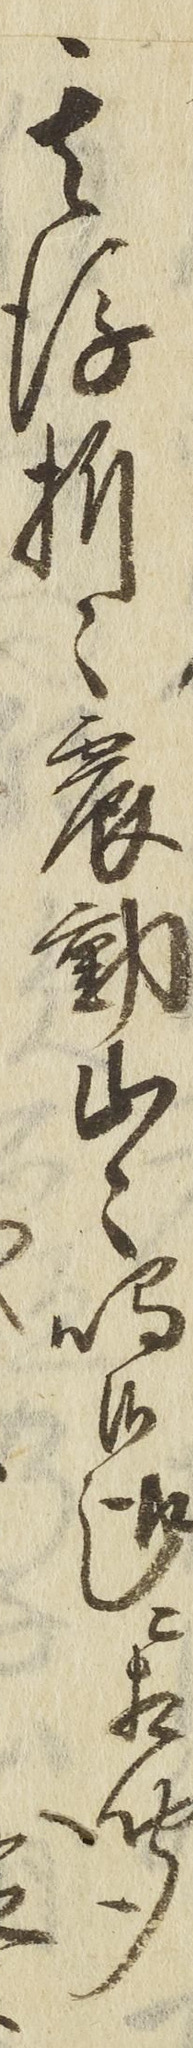其後折々震動山々鳴候趣二相聞
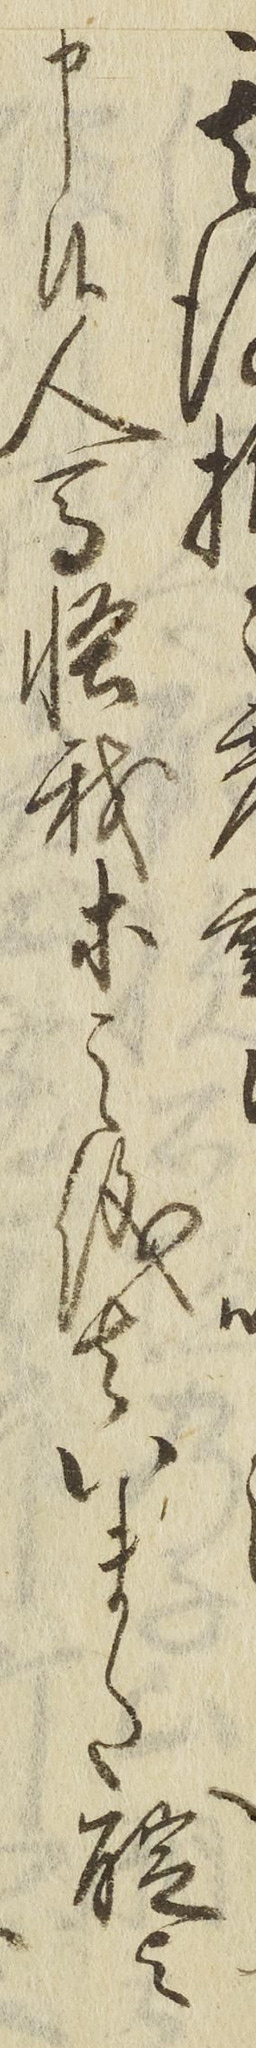申候人馬怪我等之儀はいまた聢と
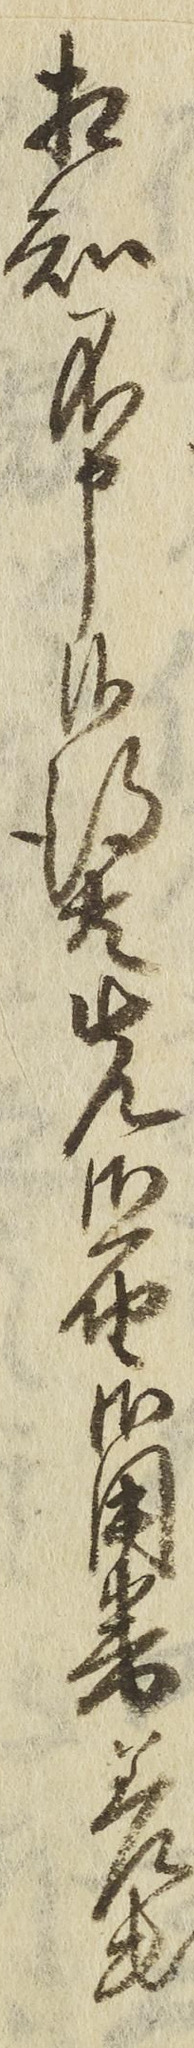相知不申候得共先御届御用番差出
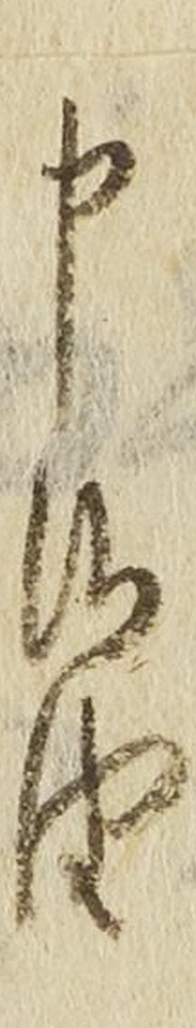申候由
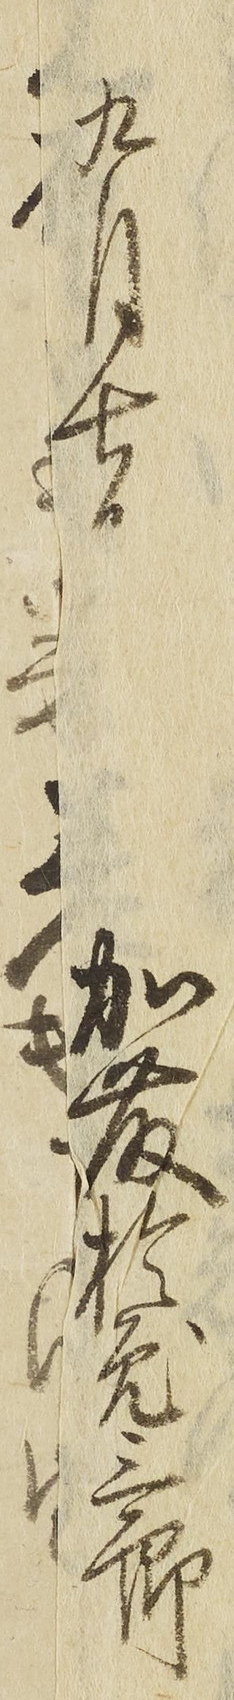九月七日加藤於兎三郎
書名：世説ヤンレフシ写、駿州田中城地震ニ付内外破損御届書、豫州大洲城地震ニ付内外破損御届書・封廻状
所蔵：東京大学地震研究所図書室 Earthquake Research Institute Library, The University of Tokyo, JAPAN
